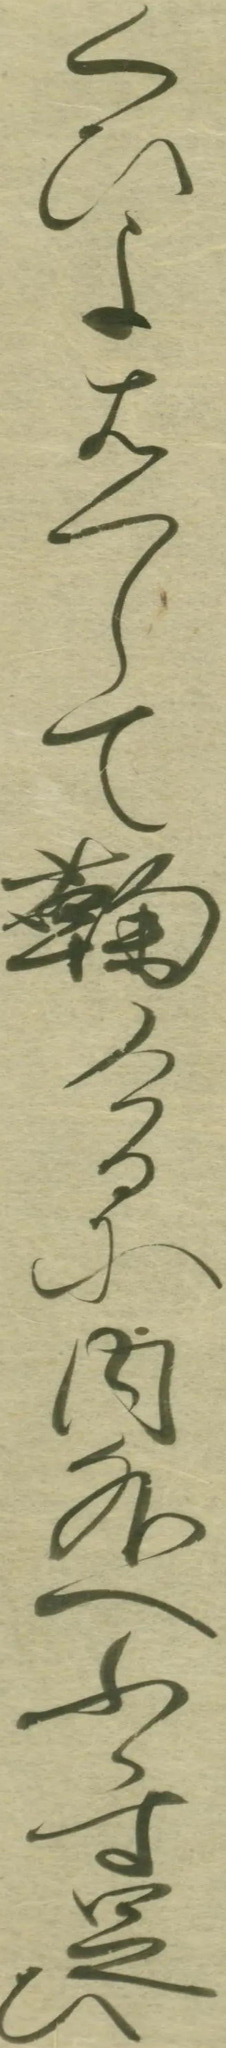くひにはつして鞠けるに内外へふらす足ひ
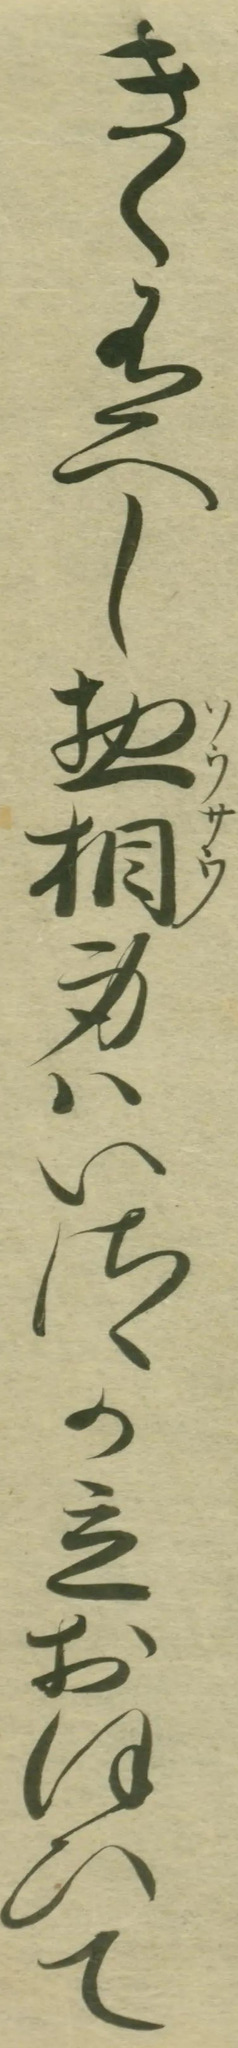きく有へし惣相身はいさゝか立おほひて
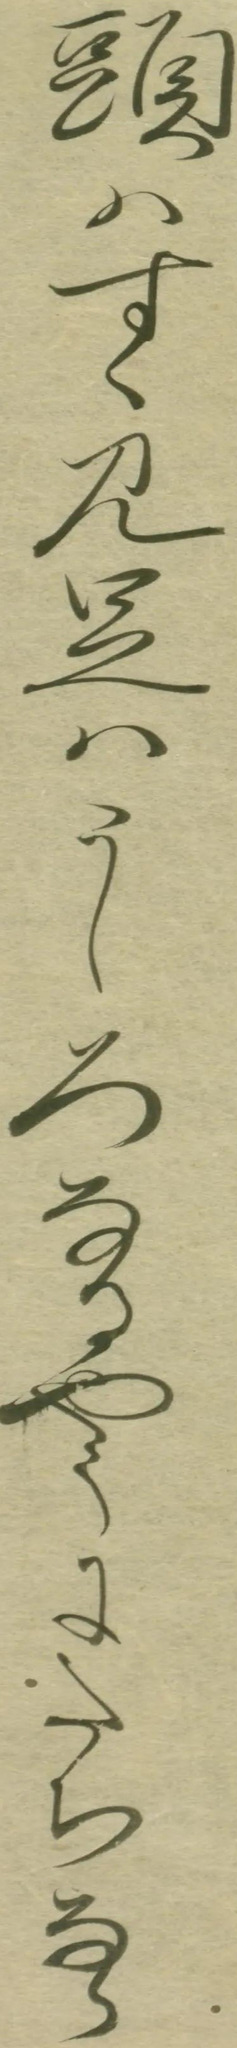頭はすゝみ足はうしろなるやうにたちなら
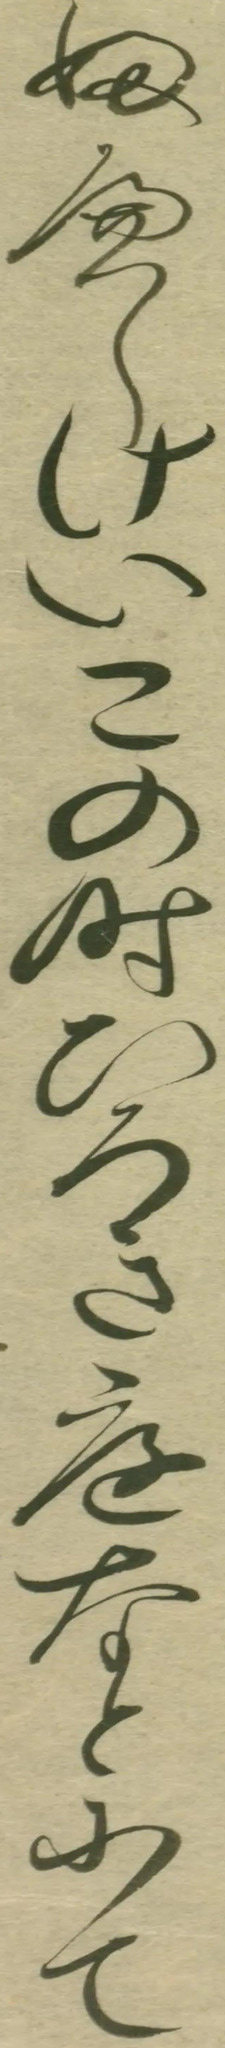ふへしけいこの時ひろき庭なとにて
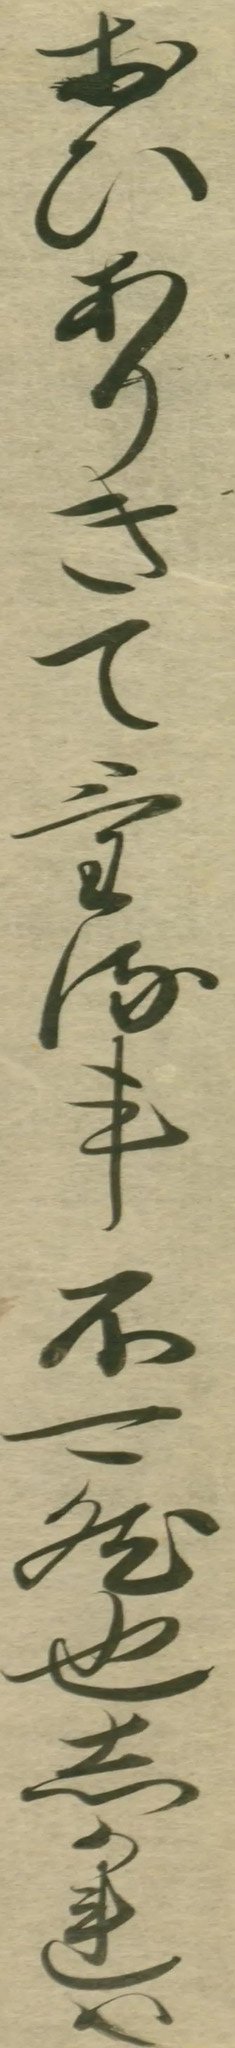おひありきてける事不可然也しかれは

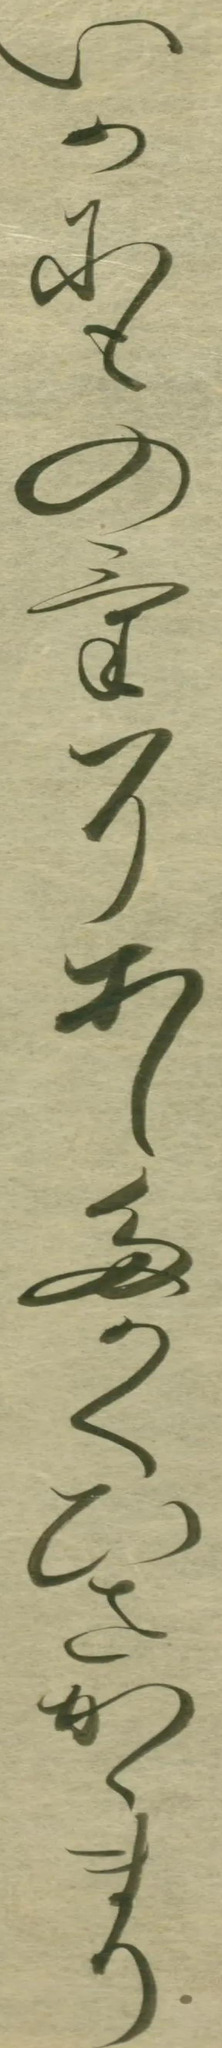いかにもの気にあしたかくひさかゝまり
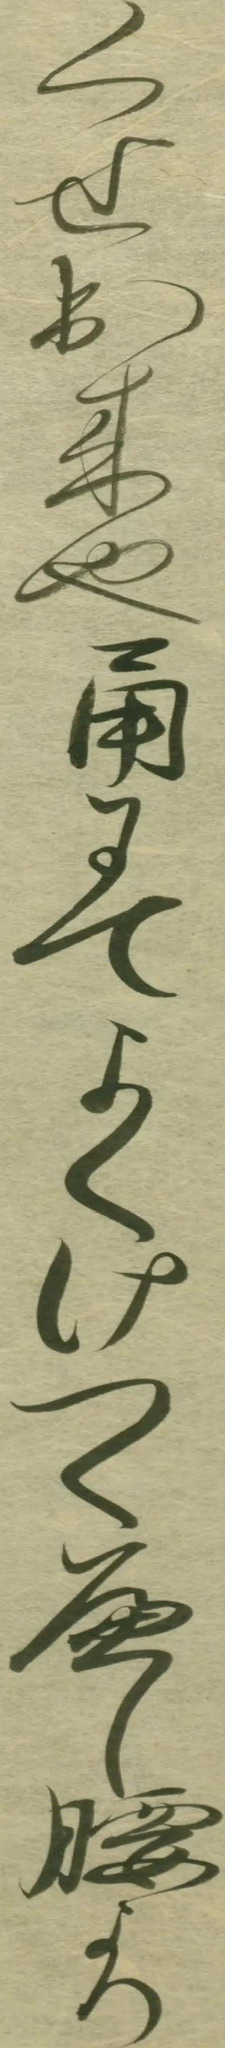くせ出来也甬にてよくけつくへし腰より
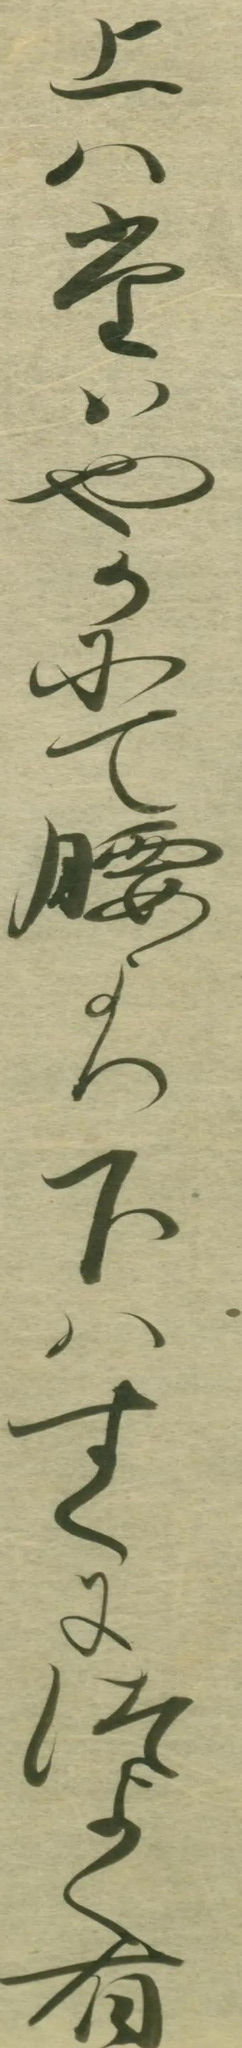上はたはやかにて腰より下はすくにつよく有
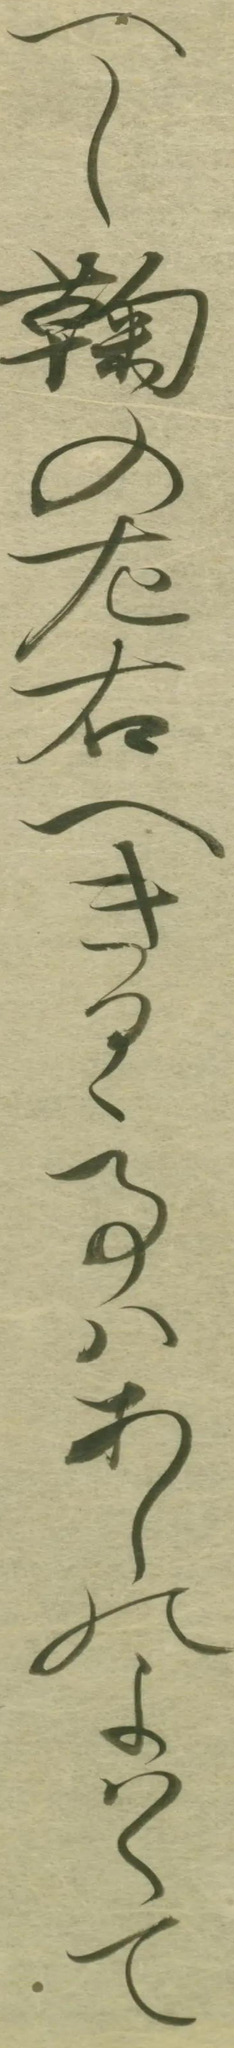へし鞠の左右へきるゝ事はあしのよはくて
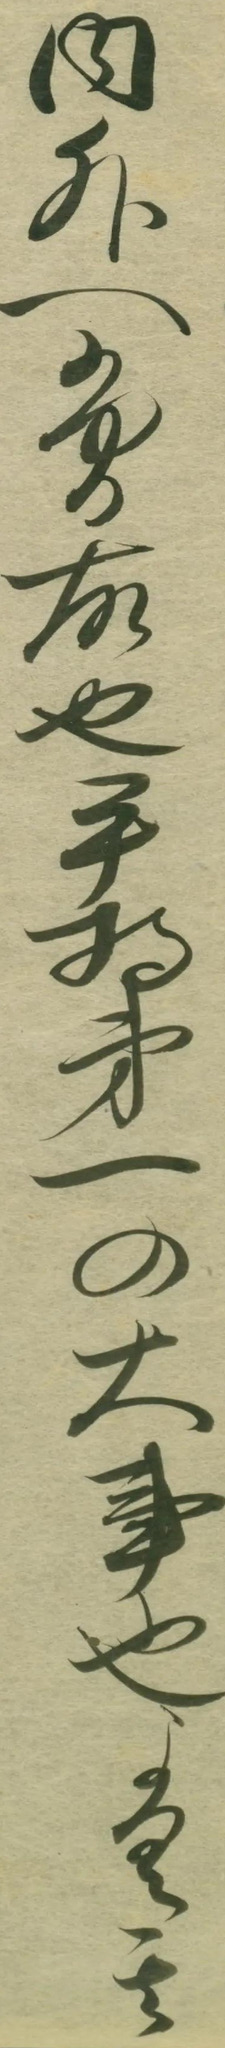内外へふる故也手持第一の大事也よく其
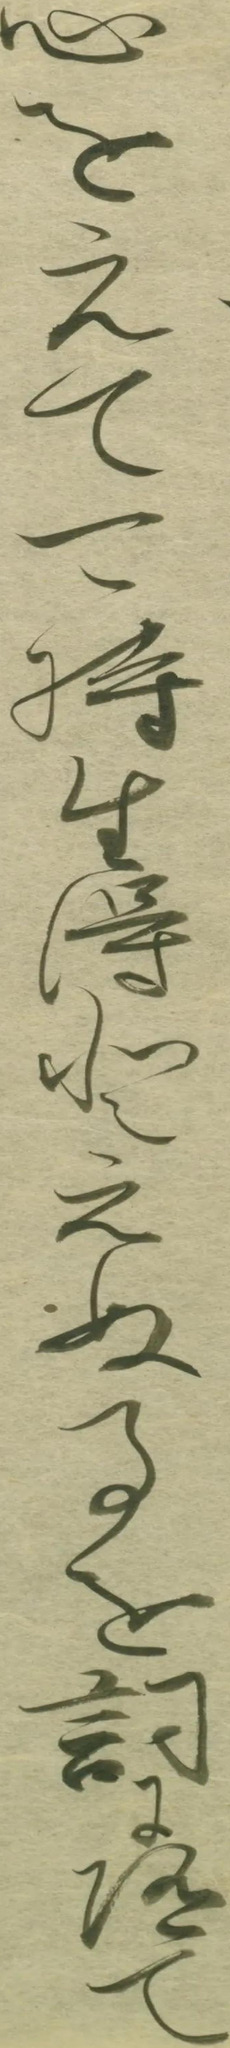心をえて可持生得とえぬ事を詞に随て
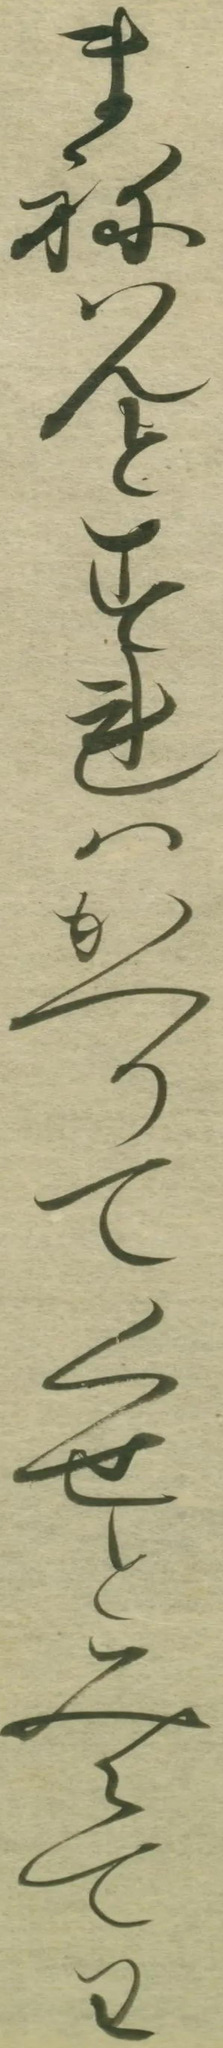まねはんとすれはかへりてくせとみえてわ
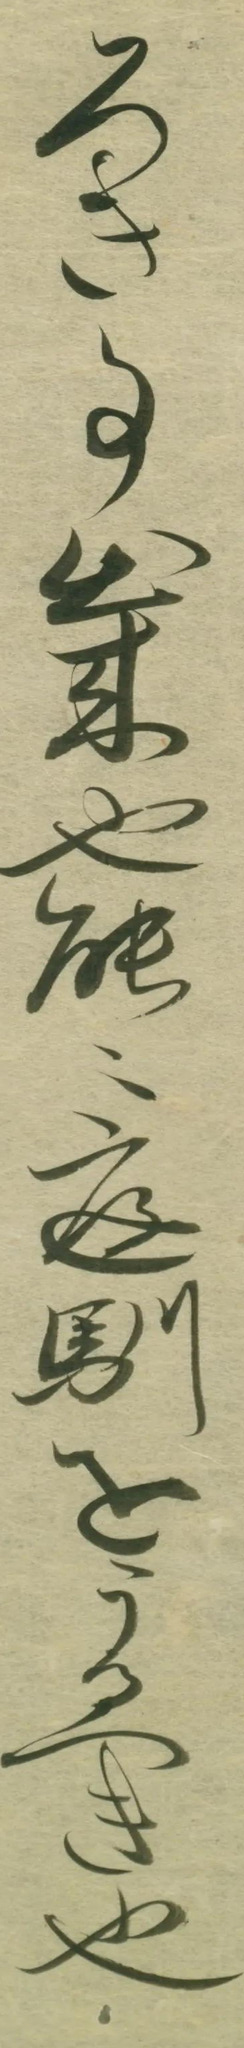ろき事出来也能々庭馴をうるへき也
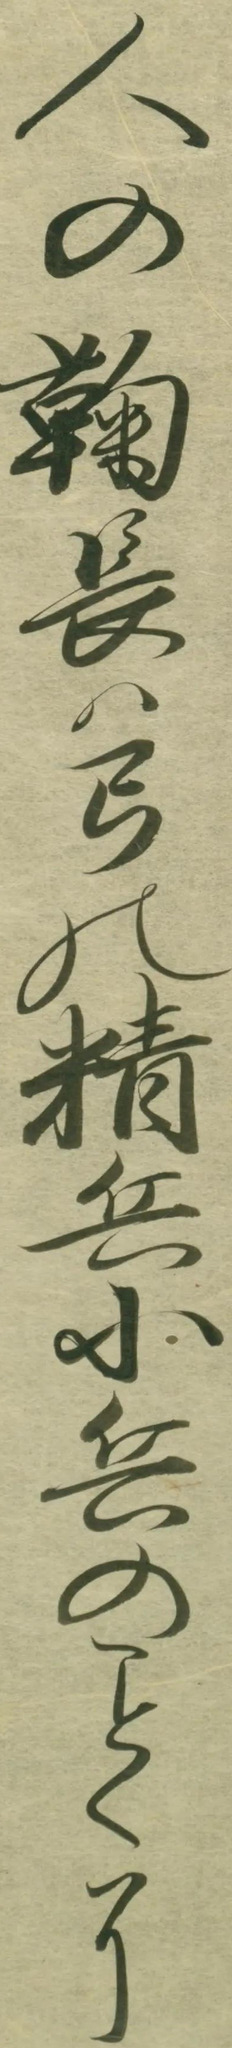人の鞠長は弓の精兵小兵のことくに
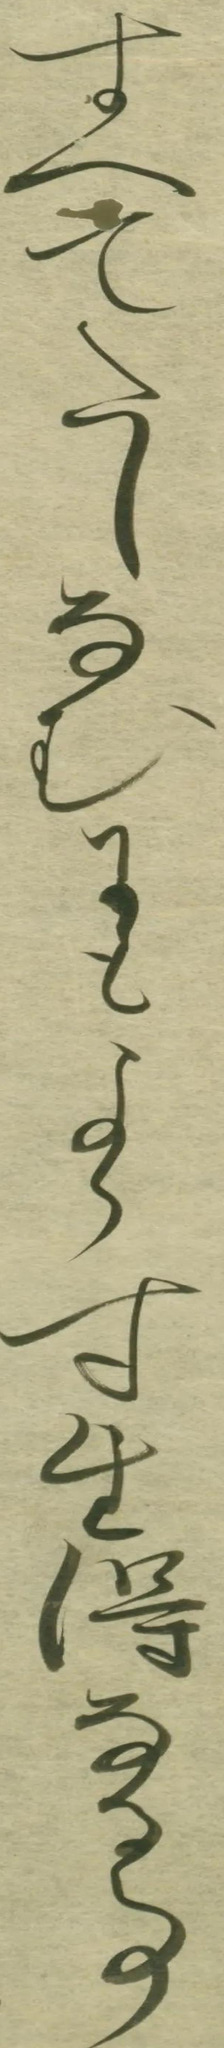すへてたしなむにもよらす生得なる事
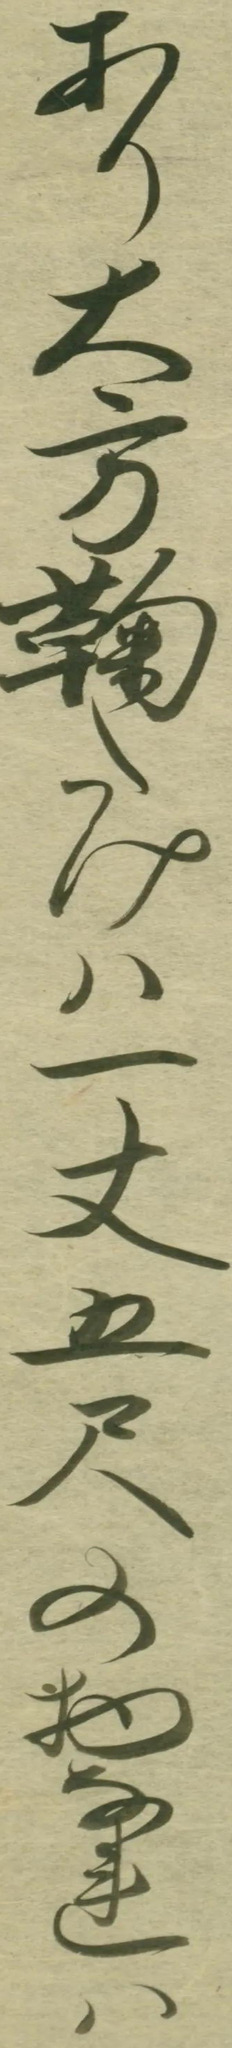あり大方鞠たけは一丈五尺の物なれは
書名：蹴鞠之条々大概
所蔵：国立国会図書館 National Diet Library, JAPAN
